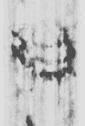邦
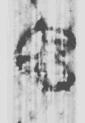{宀𠁩}
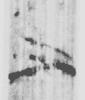之
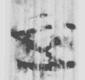正
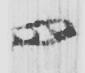四
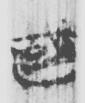國
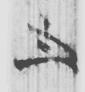之
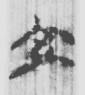交
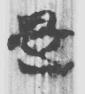是
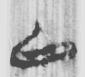㠯（以）
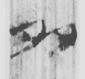多
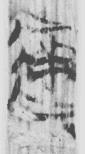{止達}
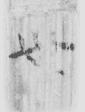卅
